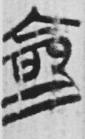命
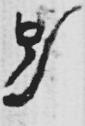也
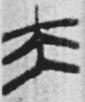夫
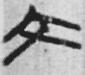文
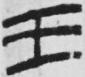王
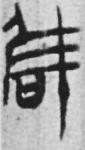唯（雖）
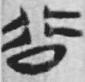谷（欲）
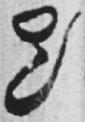已
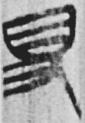○（得）
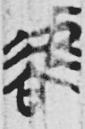唬（乎）
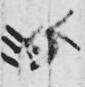此
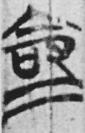命
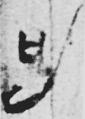也
